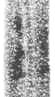之
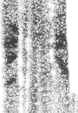天
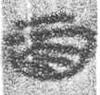百
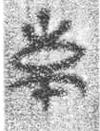束
